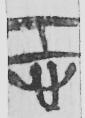{工心}
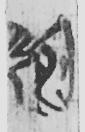溺
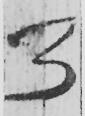乃
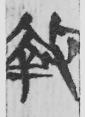{幸攴}
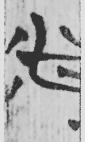釆
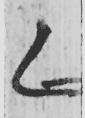㠯（以）
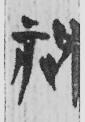祝
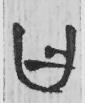曰
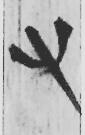又
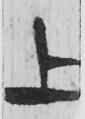上
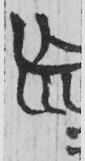巟=
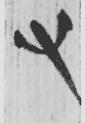又
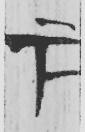下
